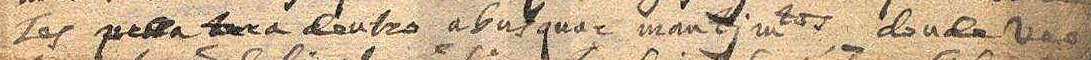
les pella tera dentro a busquar mantjmtos, donde veo
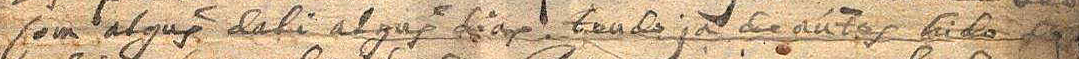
Com algus̄ dali algus̄ dias tendo ja de antes hido de
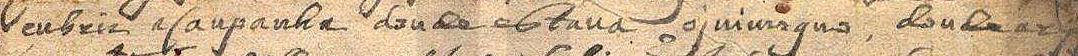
cubrir a Campanha donde estaua o jnimiguo, donde arj
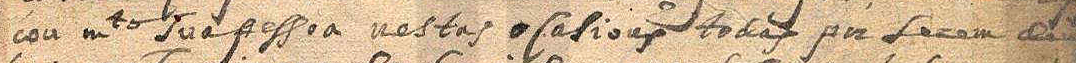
çou m.to sua pessoa nestas oCasioes todas por serem de
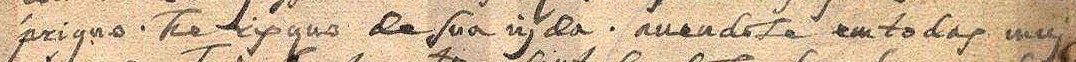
priguo. he risquo de sua ujda. auendose em todas muj a
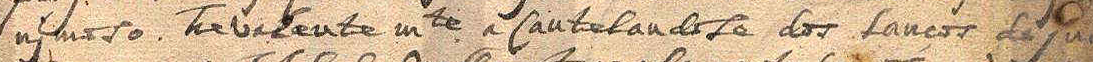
njmoso he valentemte aCautelandose dos lanços do jni
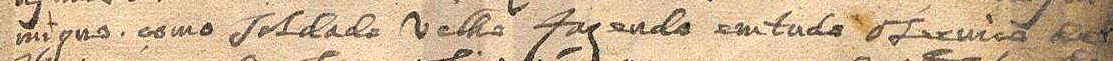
miguo como soldado velho fazendo em tudo o seruiço de
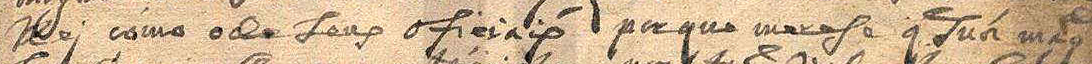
Rej como o de seus oficiais porque merese q̄ sua magde
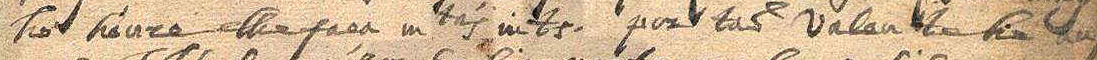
ho loure e lhe faça mtas uits por taõ valente he anj
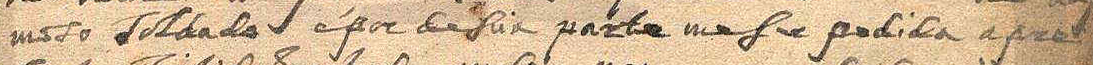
moso soldado e por de sua parte me ser podida a pre
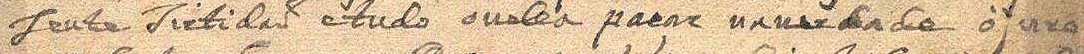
sente sirtidaõ e tudo o uale a paçar na uerdade o jura
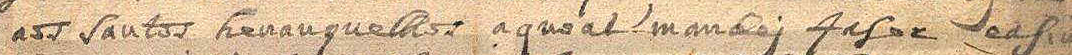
aos santos heuanguelhos a quoal mandej faser e asina
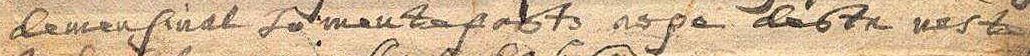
de meu sinal somente posto ao pe desta neste po
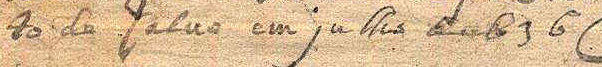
to de Caluo em julho de 636 ā
